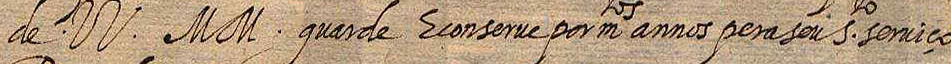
de VV. MM. guarde E conserue por mtos annos pera seu s.to seruiço
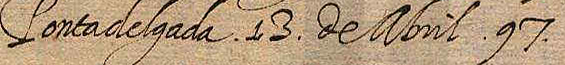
Ponta delgada. 13. de Abril .97.
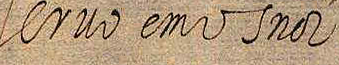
seruo em o snor̄
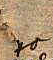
ꝑa
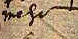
mesa
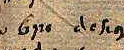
o bpo desig
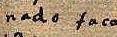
nado faca
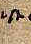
isto
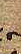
ꝑa
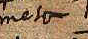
mesa +
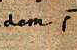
idem s̄
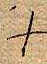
+
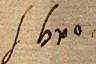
bpo
